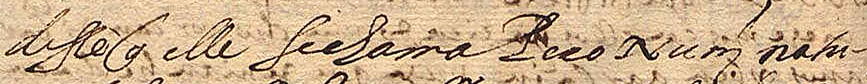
disse q̄ elle se chama Pero Nunz̄ natu
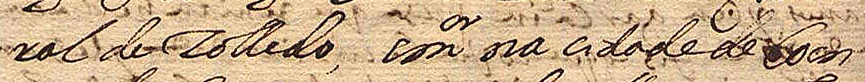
ral de Tolledo, e mor na cidade de Coen
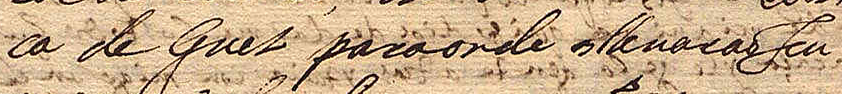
ca de Guel para onde o lleuaraõ seu
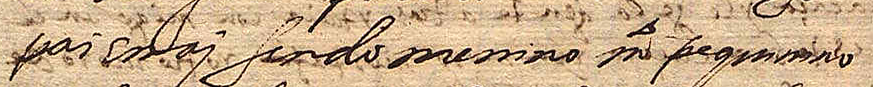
pai E maj sendo menino mto pequenino
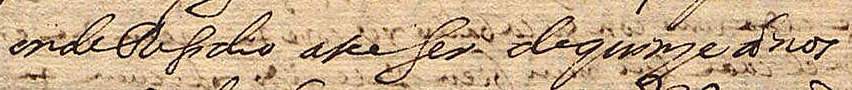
onde Residio atee ser de quinze anos
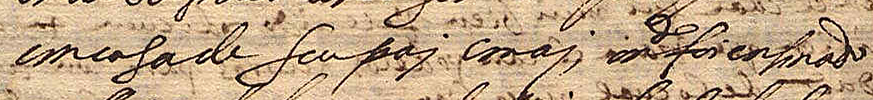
em casa de seu paj e maj, onde foi ensinado
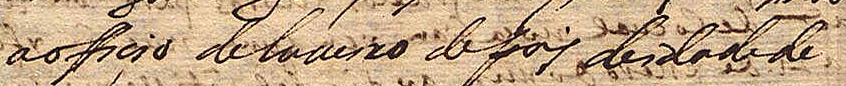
a officio de luueiro depois de idade de
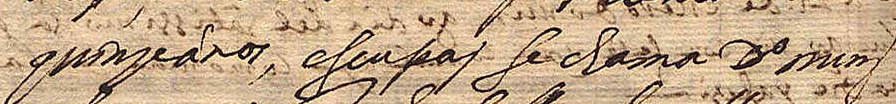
quinze ānos, e seu paj se chama Do nunz̄
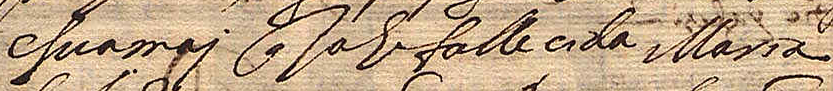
e sua maj q̄ Ja he fallecida Maria
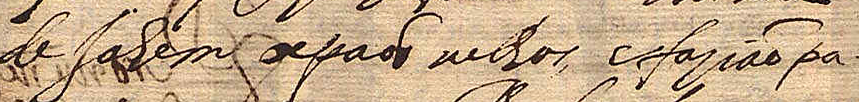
de Jahem xpaõs uelhos, e faziaõ pa
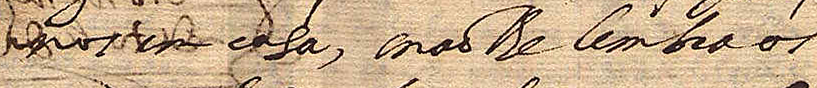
nos em casa, e naõ lhe lembra os
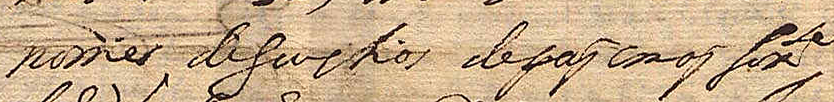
nomes de seus tios de paj e maj somte
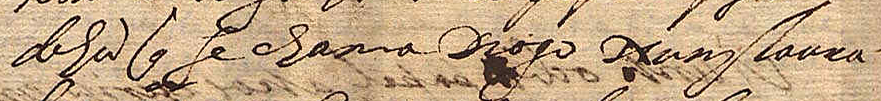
de hū q̄ se chama Diogo Nunz̄ laura
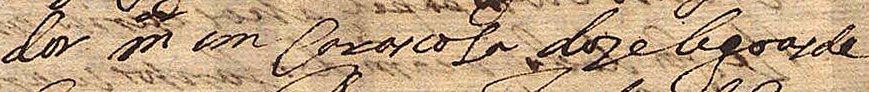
dor mor em Carascosa doze legoas de
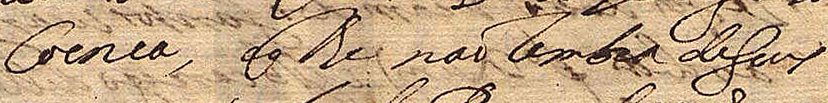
Coenca, e q̄ lhe naõ lembra de seus
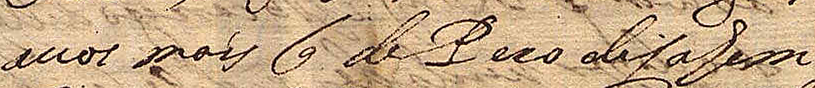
auos mais q̄ de Pero de Jahem
